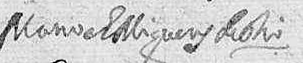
Manoel Miguens de Rio
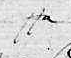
tta
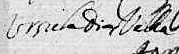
Vrsula dias Velha
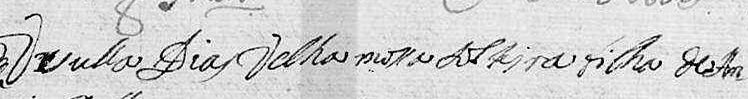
Ursulla Dias Velha mossa solteira filha de An
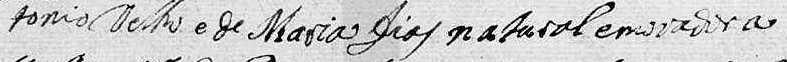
tonio Velho e de Maria Dias natural e moradora
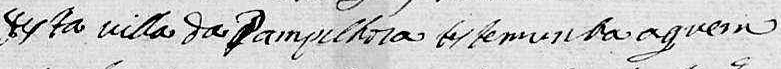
desta uilla da Pampelhoza testemunha a quem
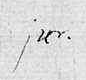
jur.
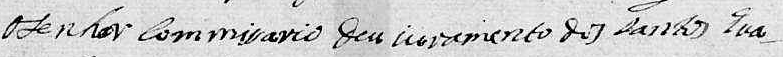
o senhor commissario deu iuramento dos santos Eua
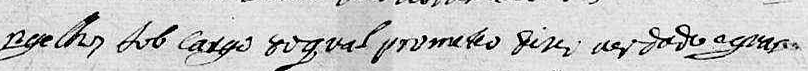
ngelhos sob cargo do qual prometeo dizer uerdade e guar
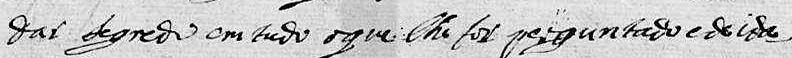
dar segredo em tudo o que lhe for perguntado e de ida
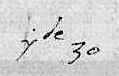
yde 30
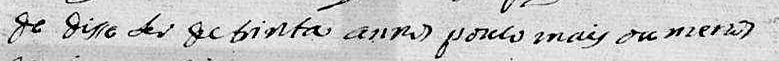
de disse ser de trinta annos pouco mais ou menos
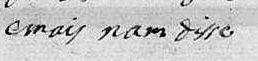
e mais nam disse
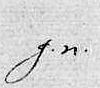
g. n.
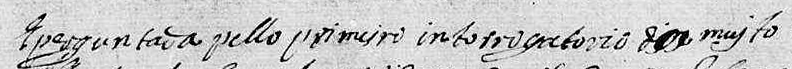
E perguntada pello primeiro intorrogatorio dos mujto
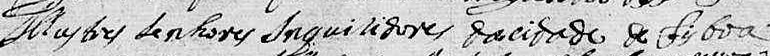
Illustres Senhores Inquizidores da cidade de Lisboa
